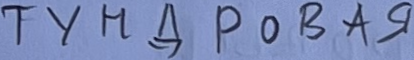тундровая
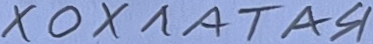хохлатая
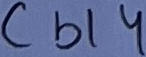сыч
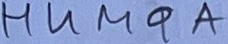нимфа
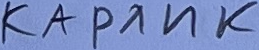карлик
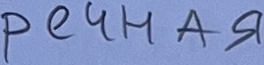речная
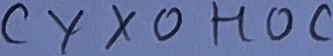сухонос
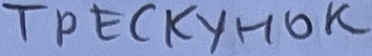трескунок
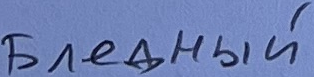бледный
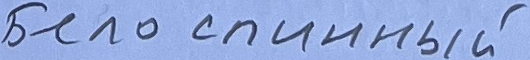белоспинный
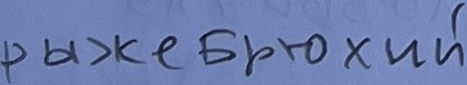рыжебрюхий
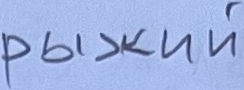рыжий
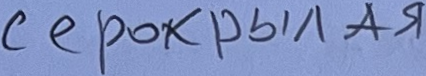серокрылая
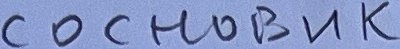сосновик
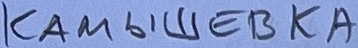камышевка
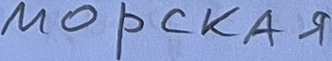морская
